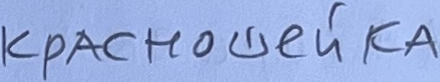красношейка
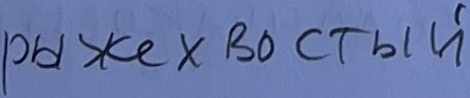рыжехвостый
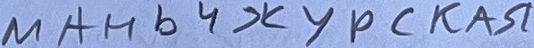маньчжурская
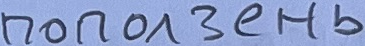поползень
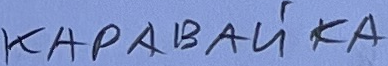каравайка
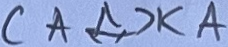саджа
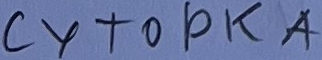сутора
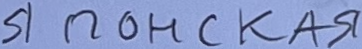японская
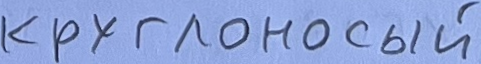круглоносый
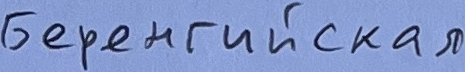беренгийская
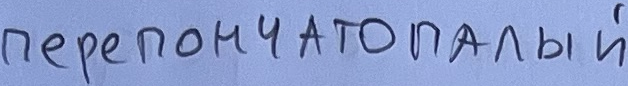перепончатопалый
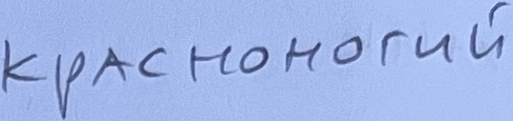красноногий
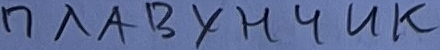плавунчик
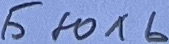бюль
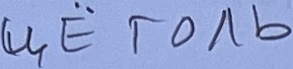щёголь
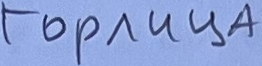горлица
